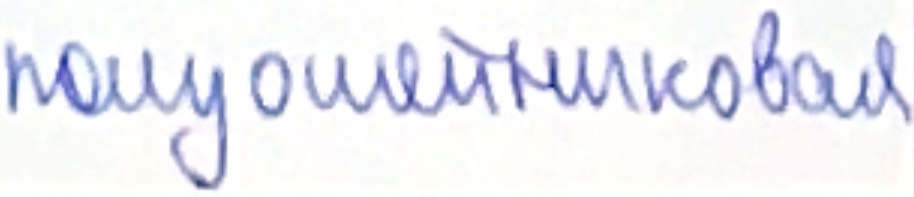полуошейниковая
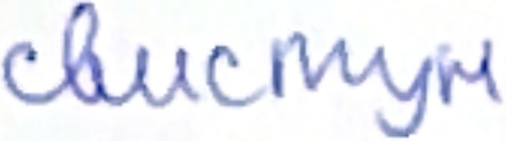свистун
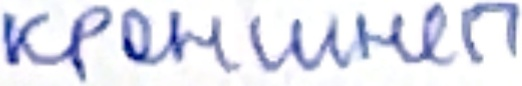кроншнеп
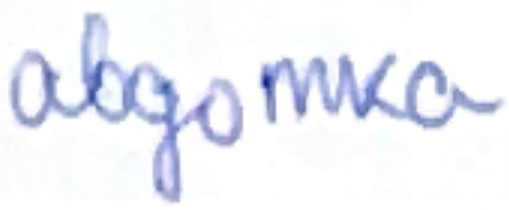авдотка
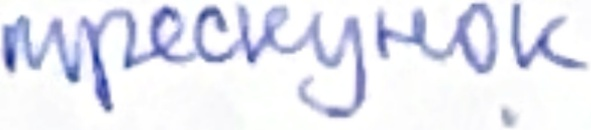трескунок
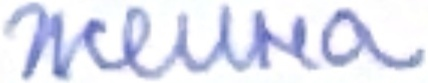желна
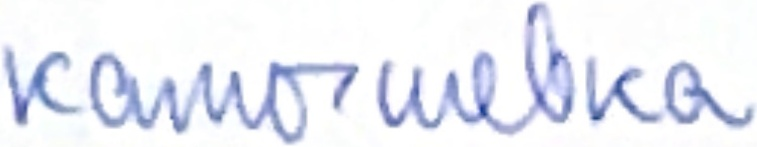камышевка
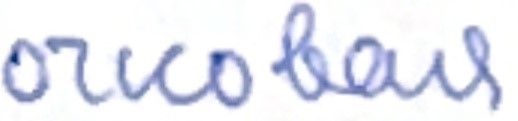очковая
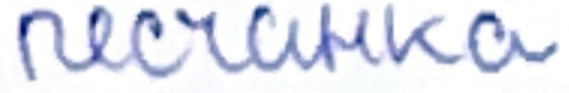песчанка
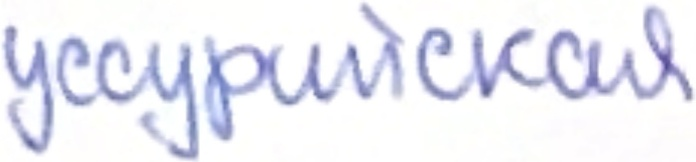уссурийская
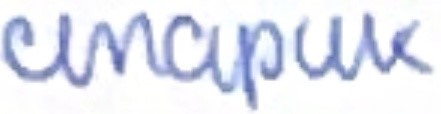старик
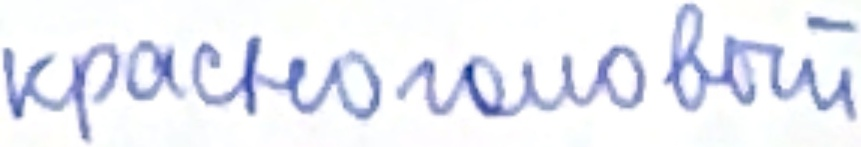красноголовый
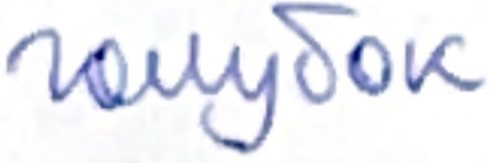голубок
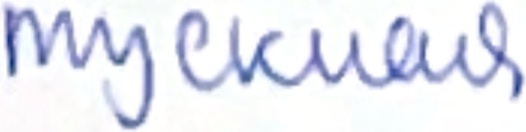тусклая
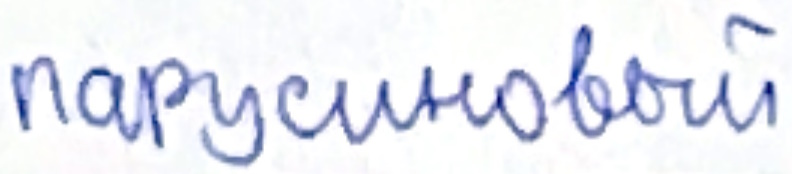парусиновый
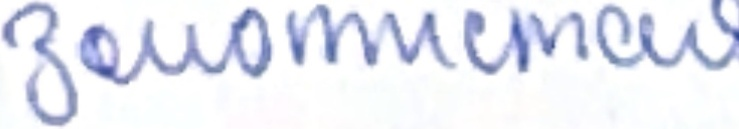золотистая
